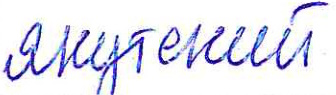якутский
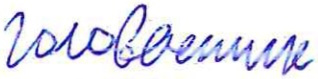головостик
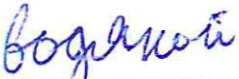водяной
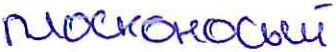плосконосый
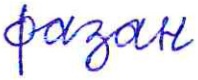фазан
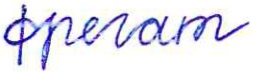фрегат
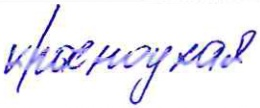красноухая
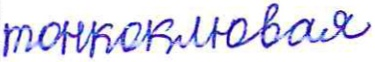тонкоклювая
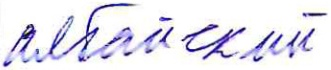алтайский
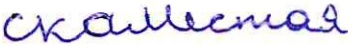скалистая
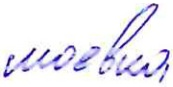моевка
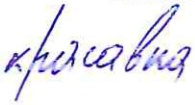красавка
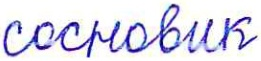сосновик
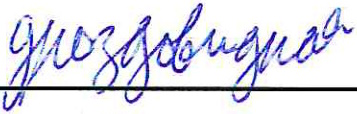дроздовидная
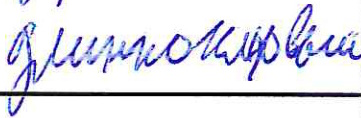длинноклювый
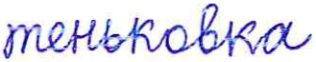теньковка
